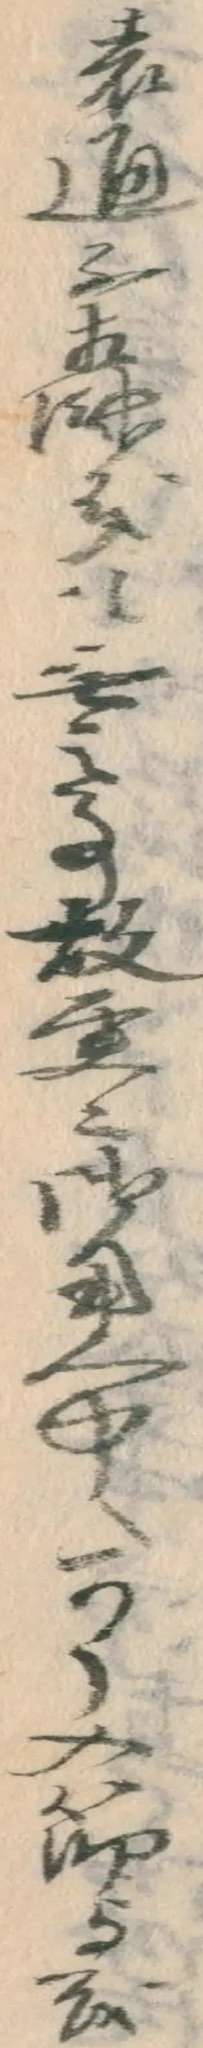表通不相済義も無之事故更ニ御用人中へ可申入筋とも

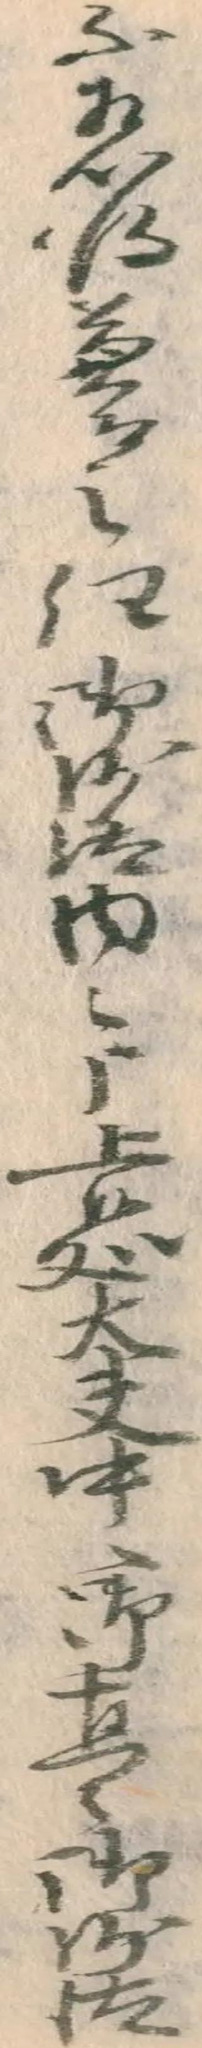不相心得兼而之任御沙汰内々申上候処大夫中へ御直々御沙法
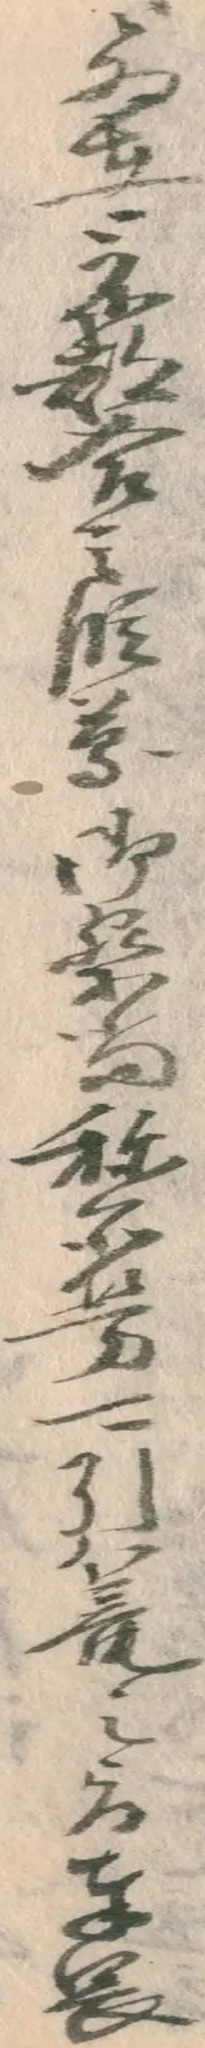被為在御不都合之段蒙御尋當称所労可引籠之旨奉畏
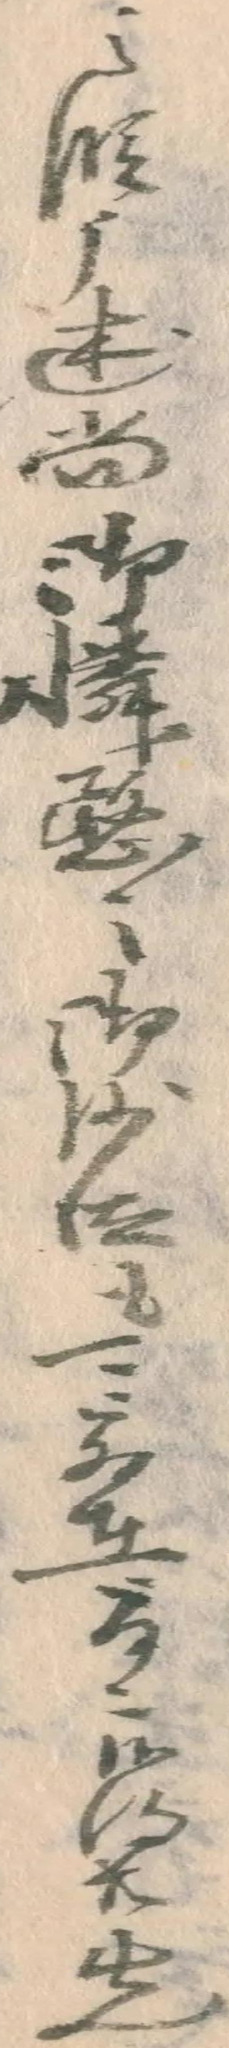之段申述尚御憐愍之御沙汰も可御在旨ニ候得共先
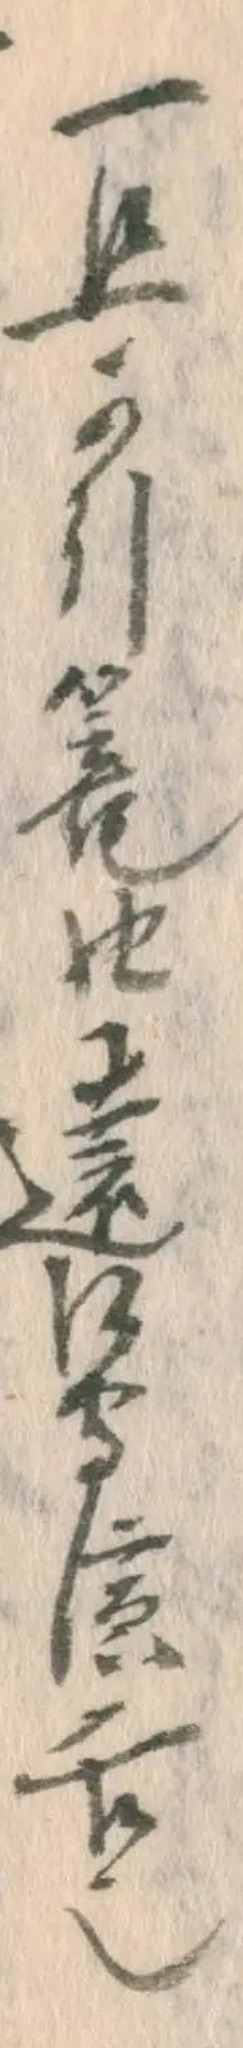一旦可引篭由遠江守演舌也
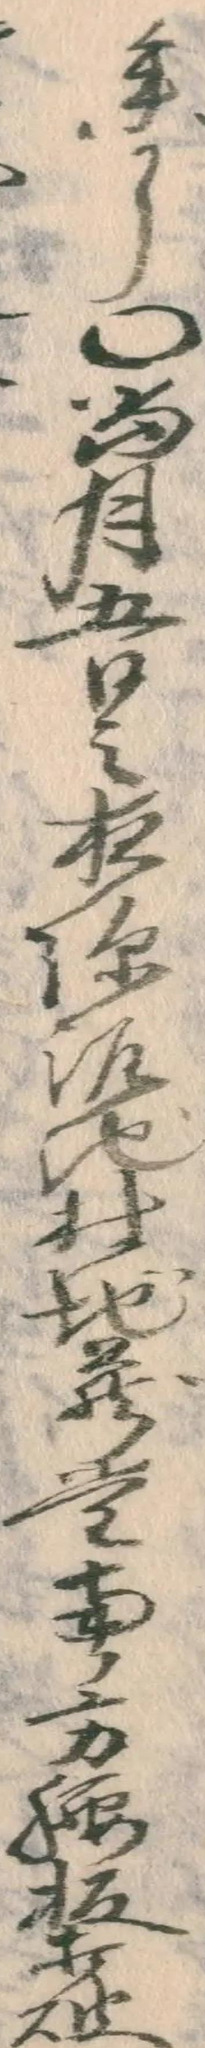参了〇當月五日之夜深泥池村地蔵堂南ノ方腰板打破
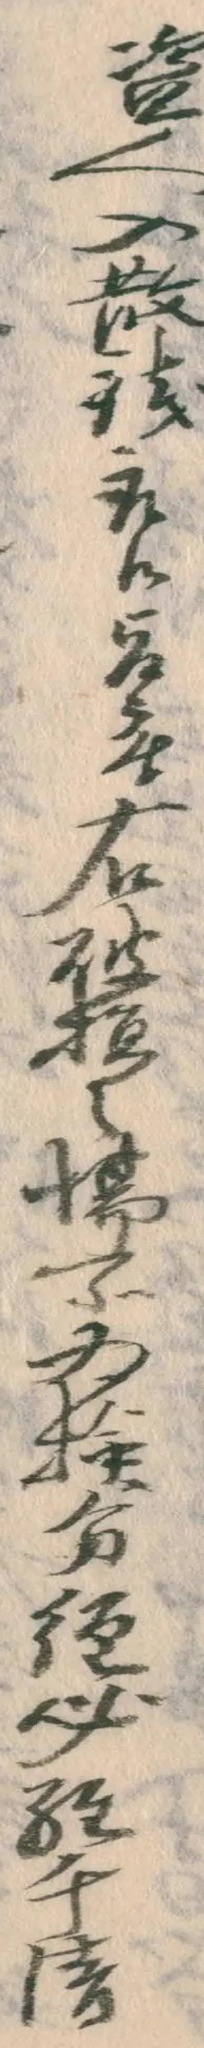盗人入散銭取候旨ニ付右破損之場所為検分経必経千清
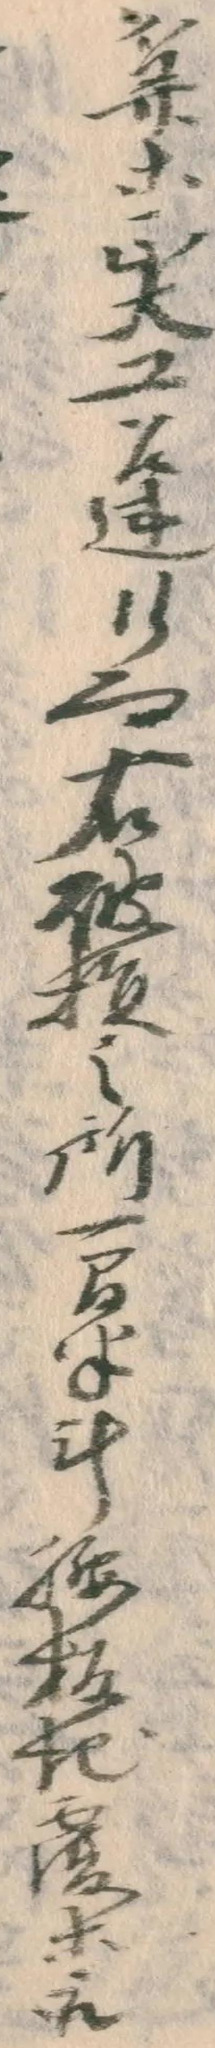算等正大工召連行向右破損之所一間半斗腰板地覆等取
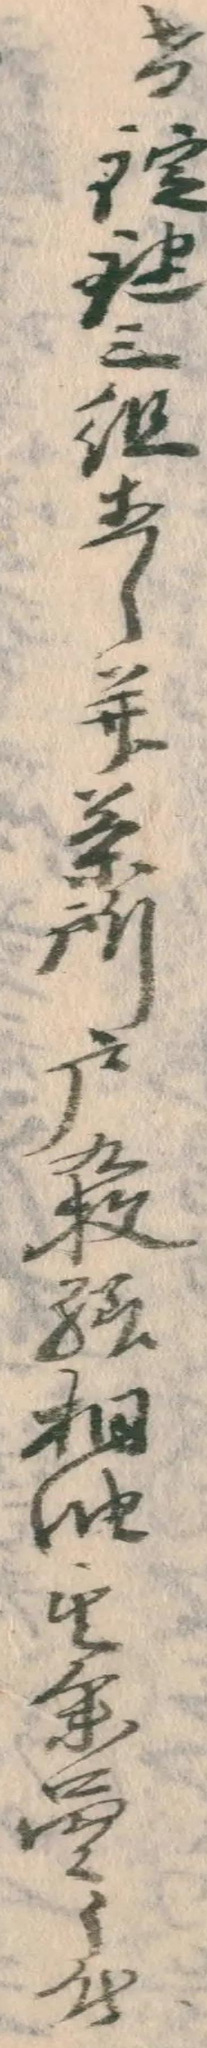出錠鍵三組直し并茶所戸九枚強相油其余品々申付
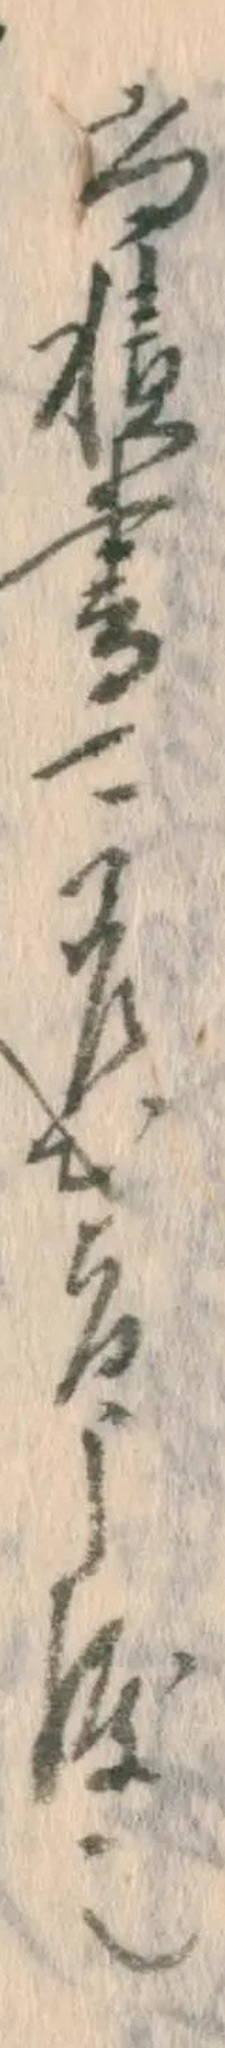尚積書可差出旨申渡也
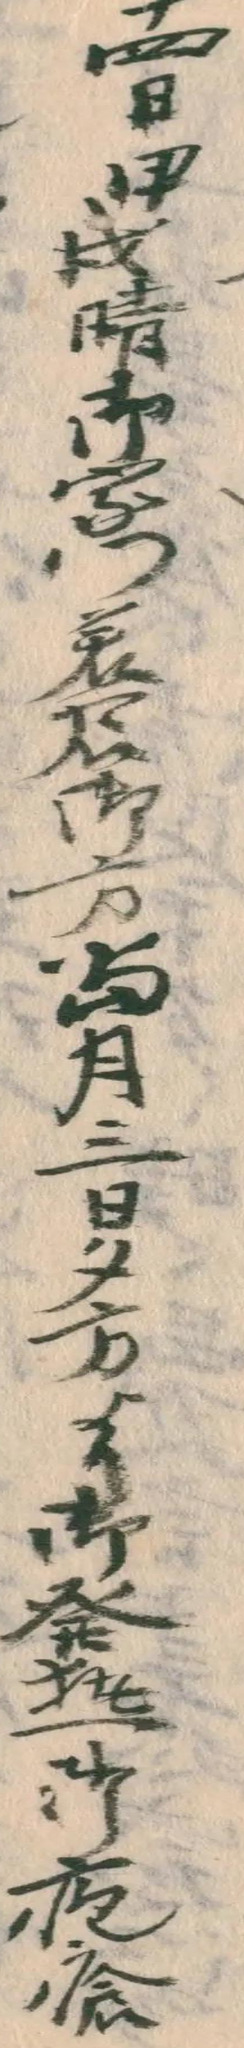十四日甲戌晴御家門若君御方當月三日夕方より御発熱御疱瘡
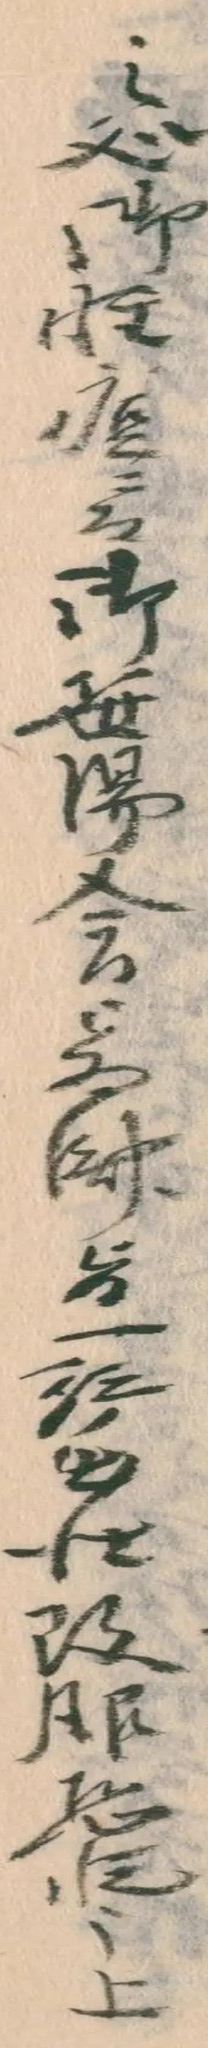之処御軽痘ニ而御笹湯舎被為済旨一統出仕改服恐悦申上
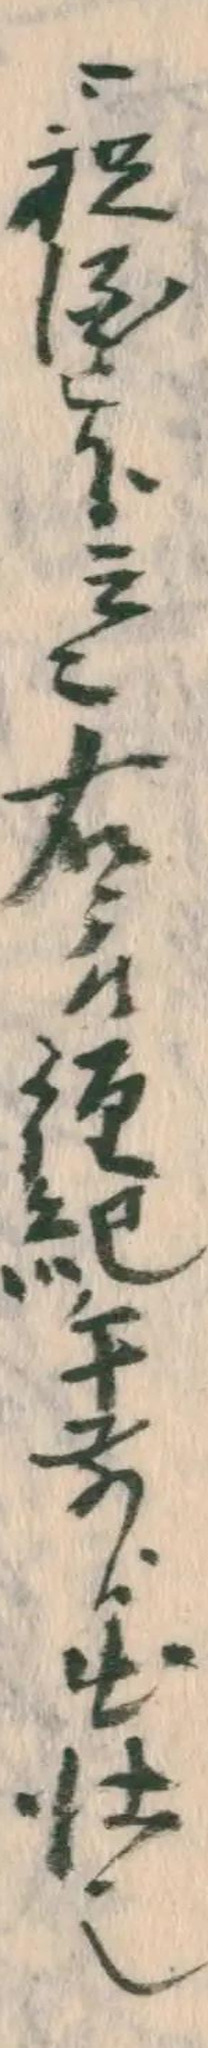御祝儀被下云々右ニ付経紀午前ゟ出仕也
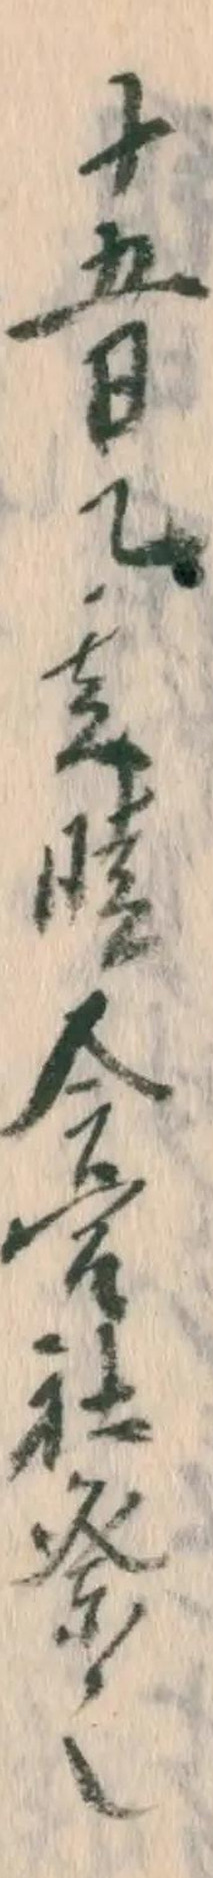十五日乙亥晴今宮社祭也
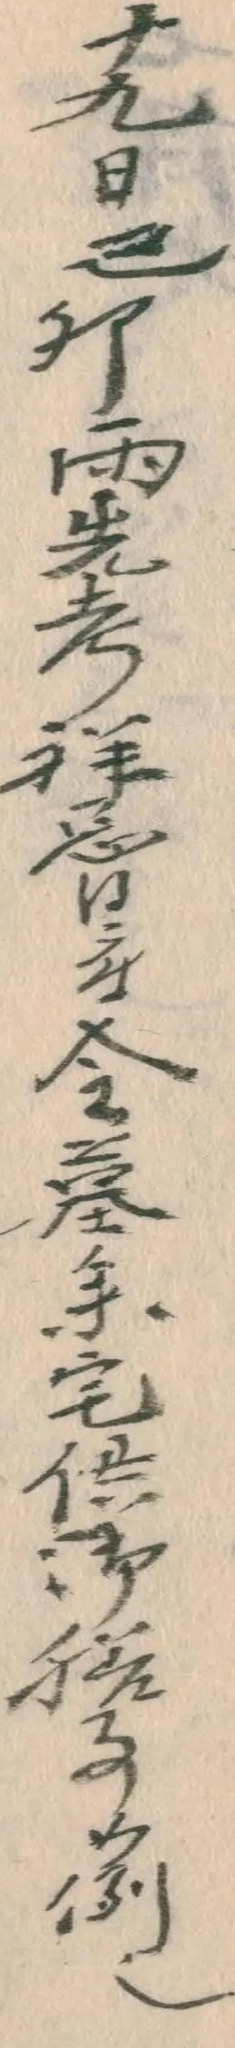十九日己卯雨先考祥忌日ニ付令墓参宅供御膳事如例也
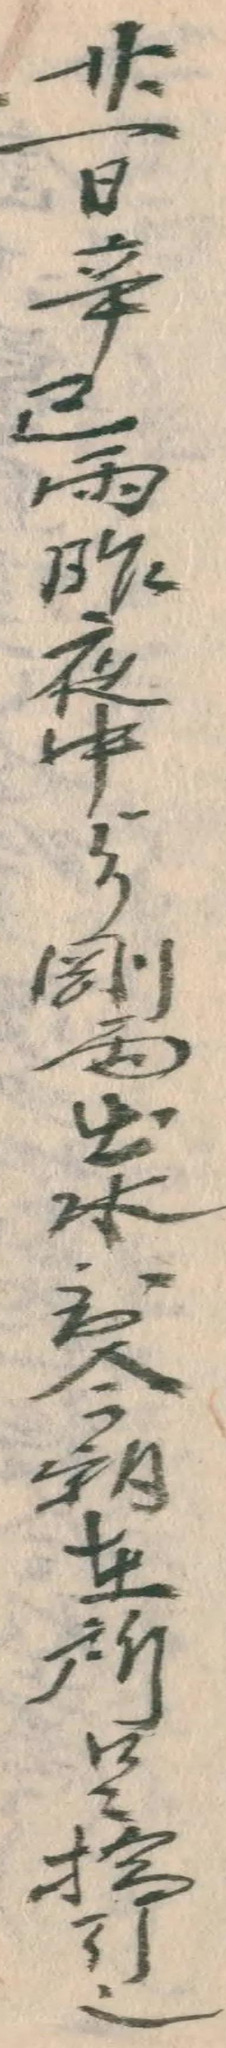廿一日辛巳雨昨夜中より剛雨出水到今朝在所口々橋引也
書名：賀茂社記録. 第70冊
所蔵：国立国会図書館 National Diet Library, JAPAN
